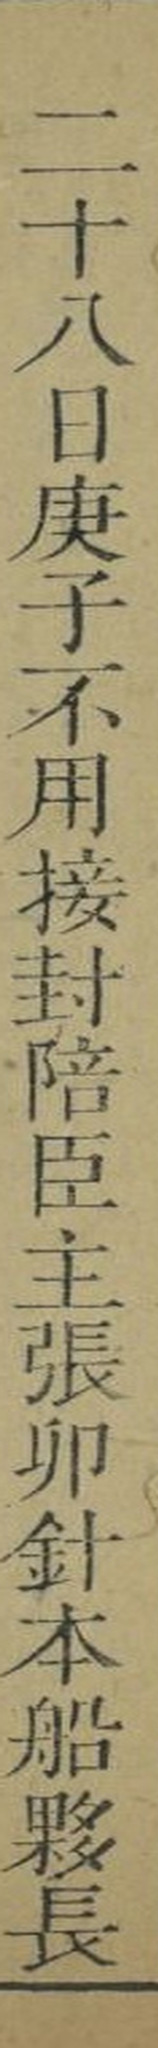二十八日庚子不用接封陪臣主張卯針本船夥長
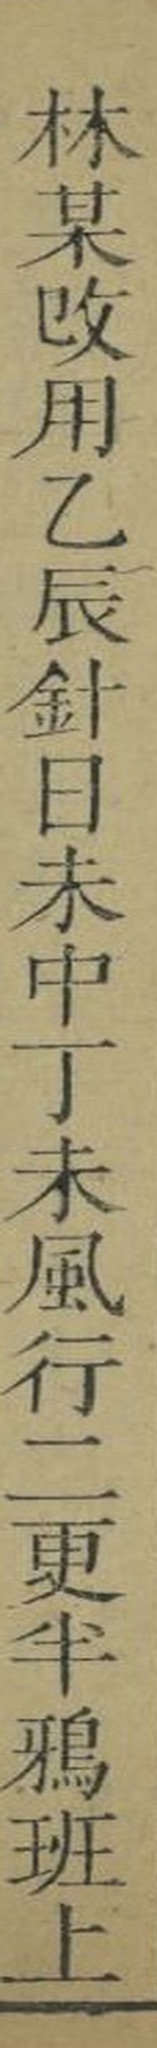林某攺用乙辰針日未中丁未風行二更半鴉班上
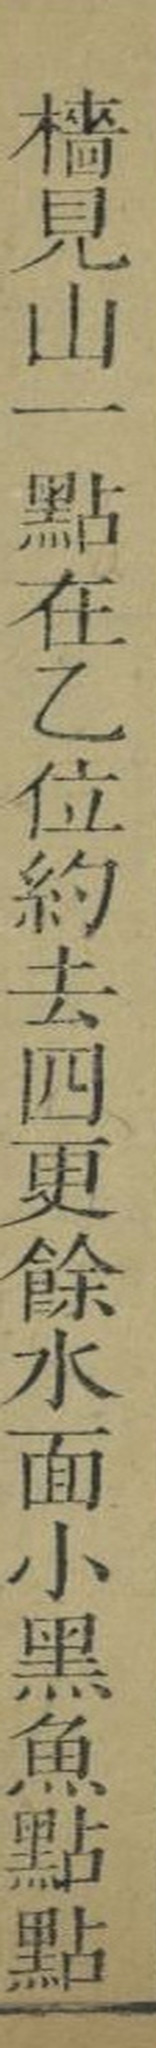檣見山一點在乙位約去四更餘水面小黑魚點點
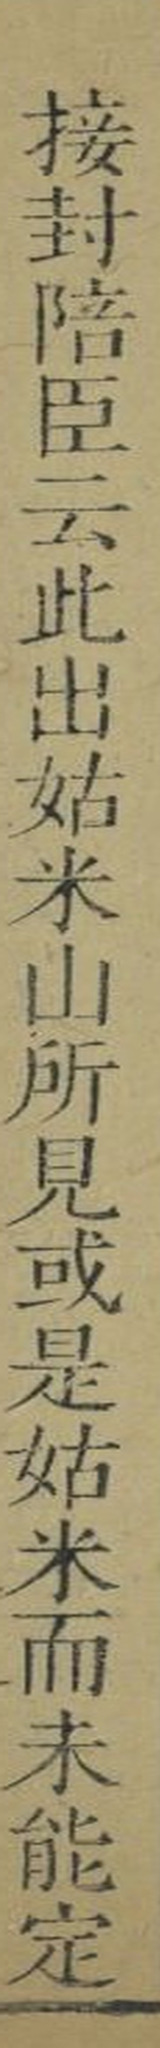接封陪臣云此出姑米山所見或是姑米而未能定
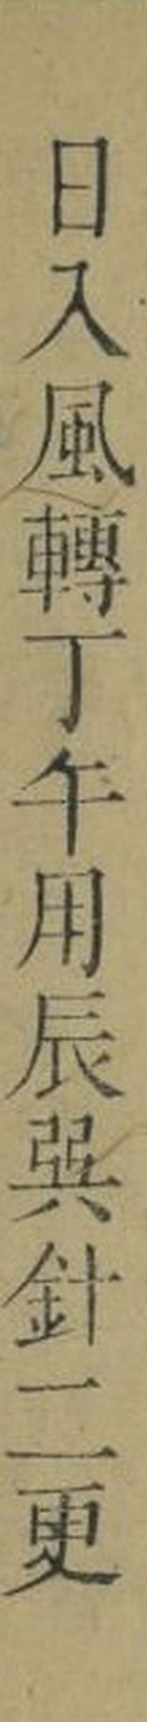日入風轉丁午用辰㢲針二更
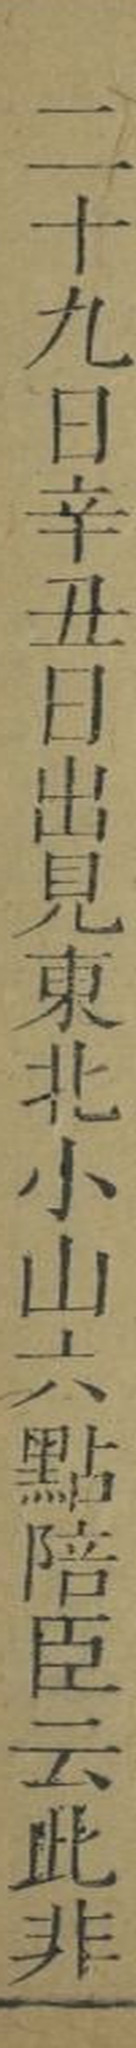二十九日辛丑日出見東北小山六點陪臣云此非

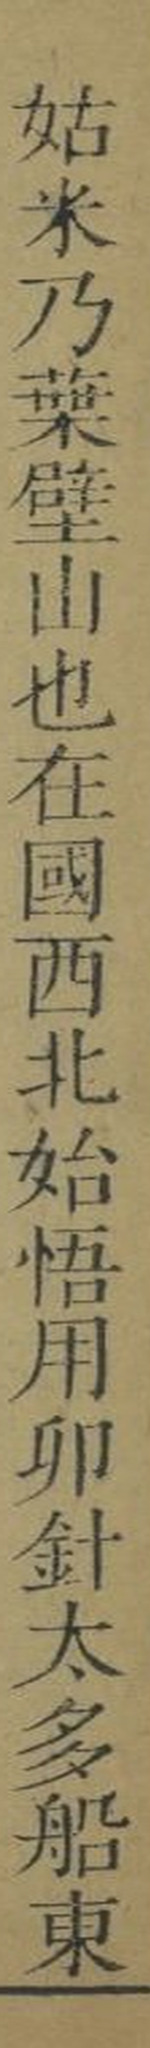姑米乃葉壁山也在國西北始悟用卯針太多船東
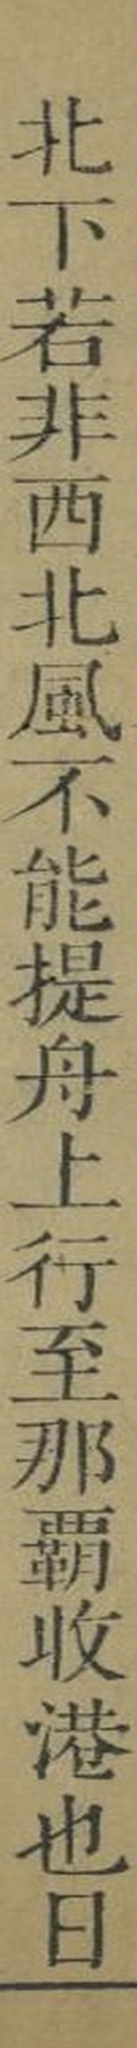北下若非西北風不能提舟上行至那覇收港也日
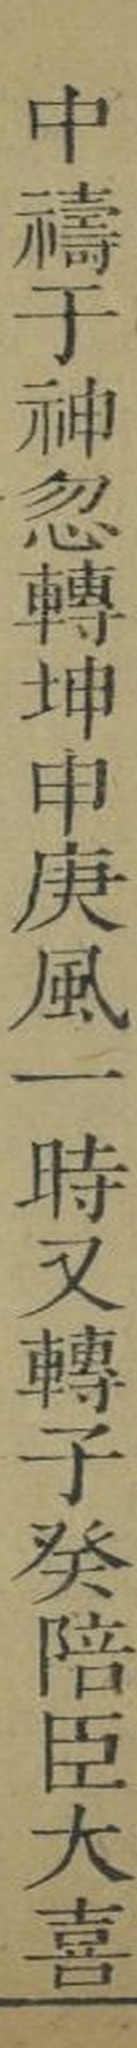中禱于神忽轉坤申庚風一時又轉子癸陪臣大喜
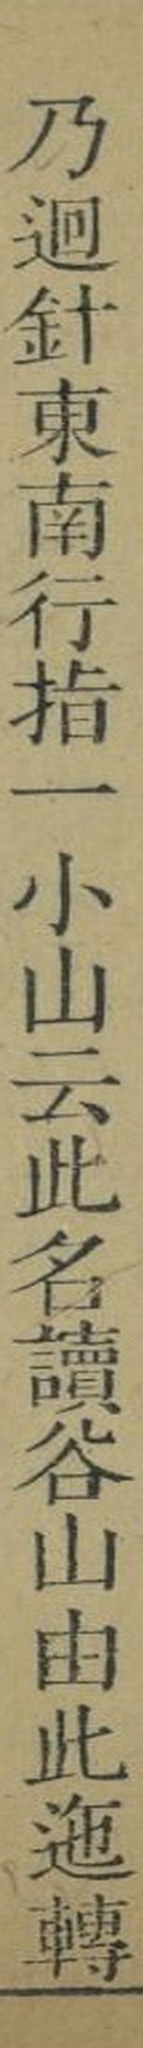乃迴針東南行指一小山云此名讀谷山由此迤轉
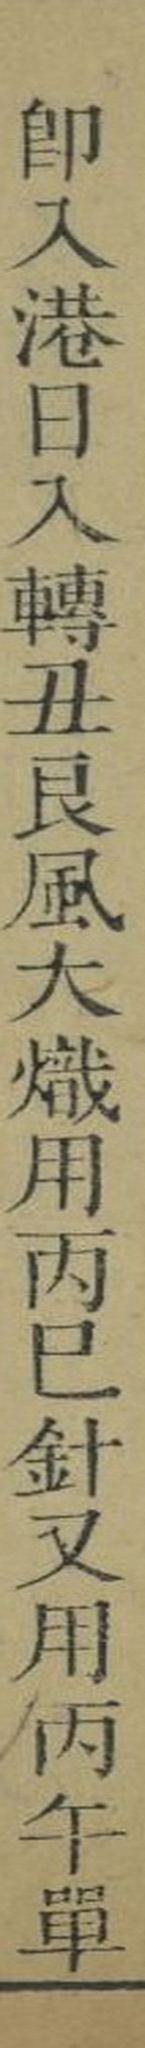卽入港日入轉丑艮風大熾用丙巳針又用丙午單
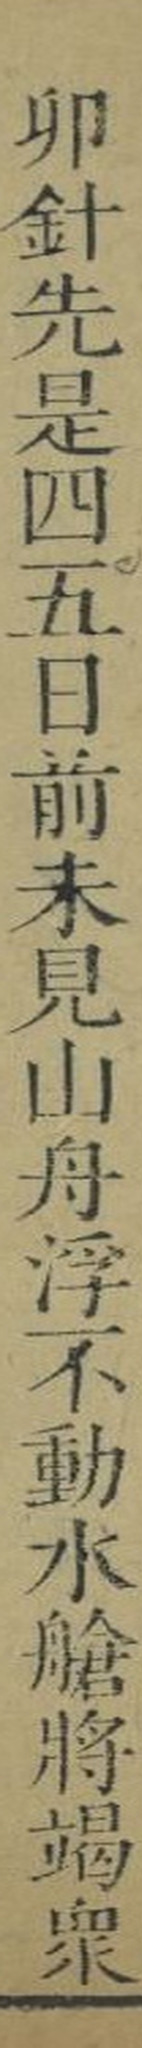卯針先是四五日前未見山舟浮不動水艙將竭衆
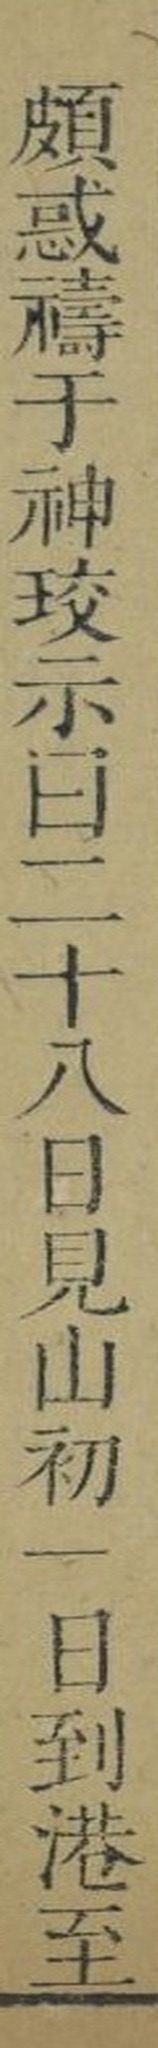頗惑禱于神珓示曰二十八日見山初一日到港至
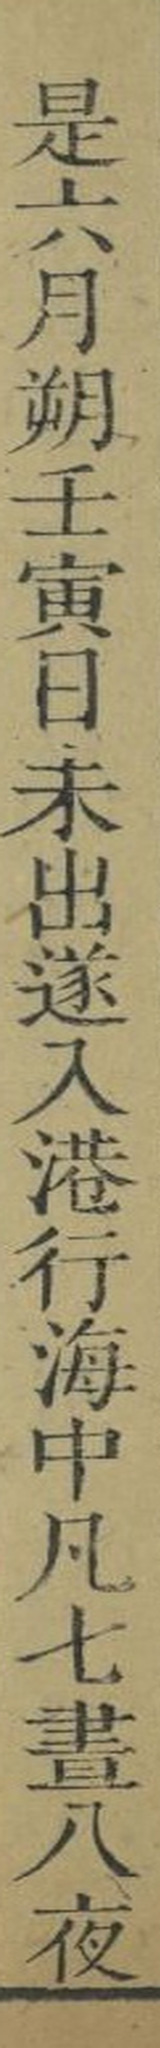是六月朔壬寅日未出遂入港行海中凡七晝八夜
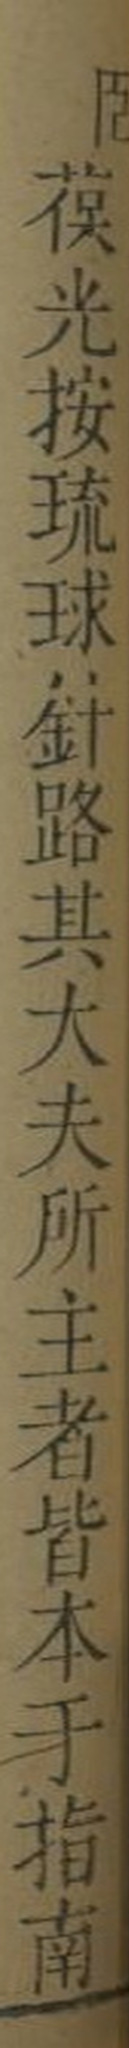臣葆光按琉球針路其大夫所主者皆本于指南
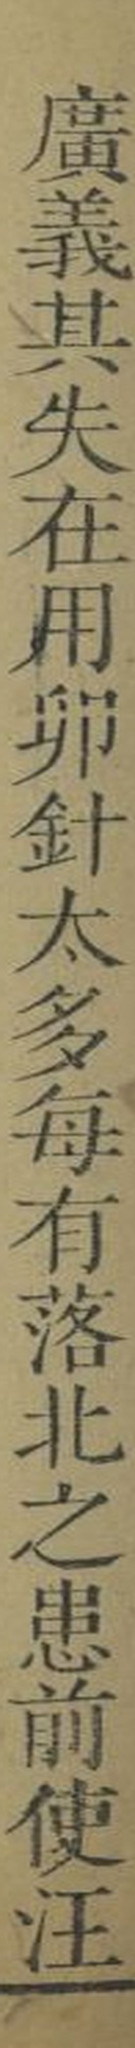廣義其失在用卯針太多每有落北之患前使汪
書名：中山伝信録 巻一
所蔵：University of the Ryukyus Library
